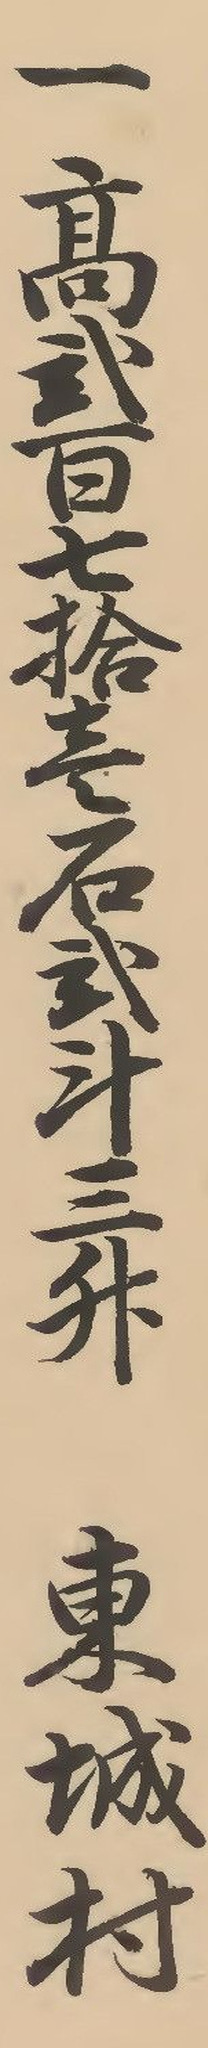一高弐百七拾壱石弐斗三升東城村
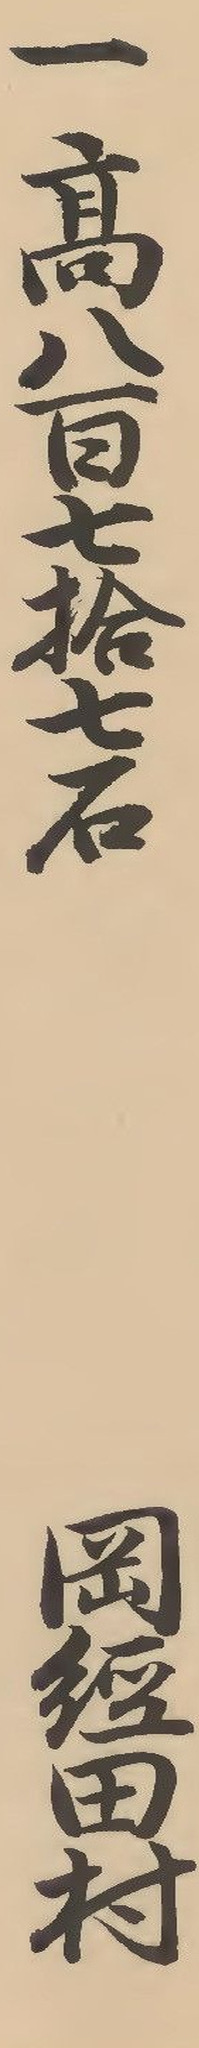一高八百七拾七石岡経田村
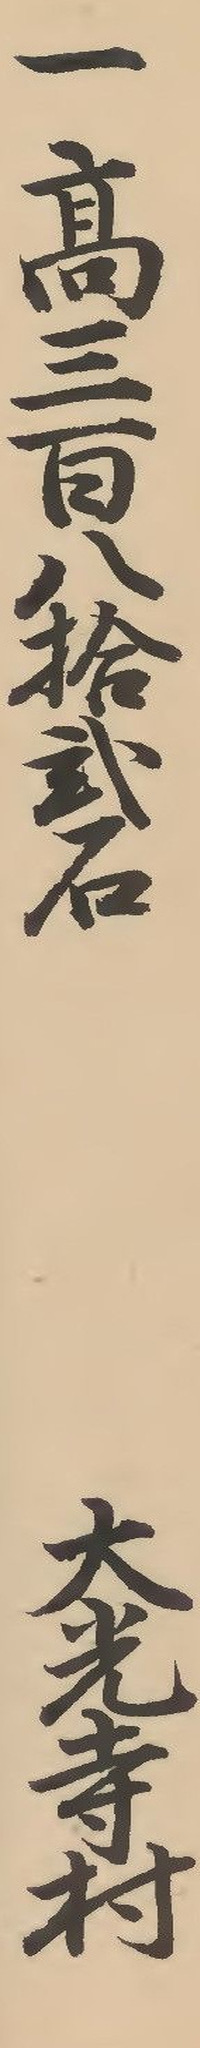一高三百八拾弐石大光寺村
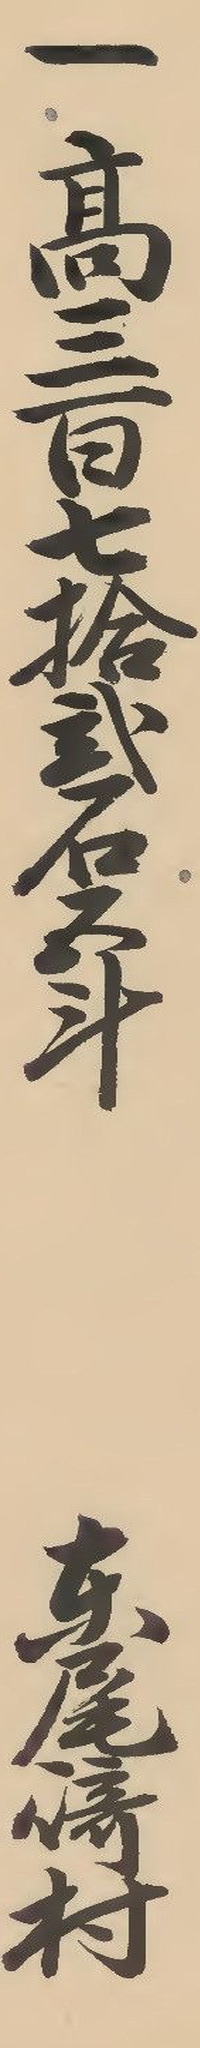一高三百七拾弐石五斗東尾崎村

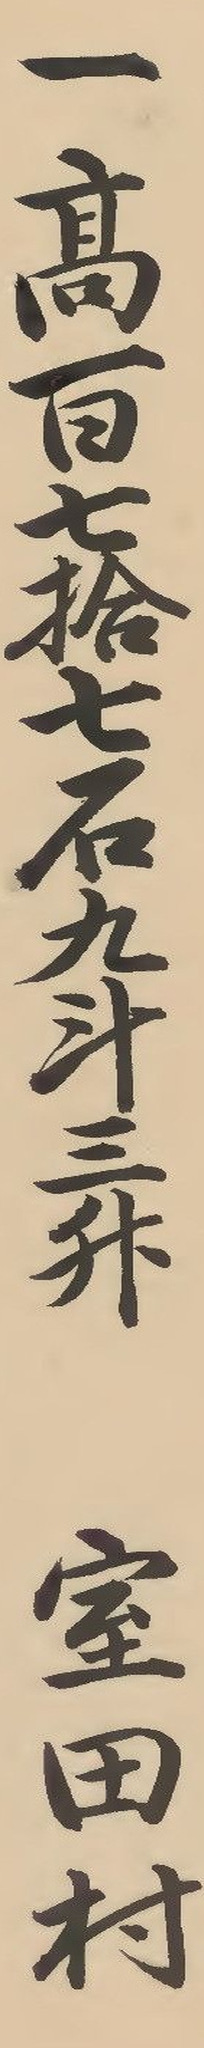一高百七拾七石九斗三升室田村
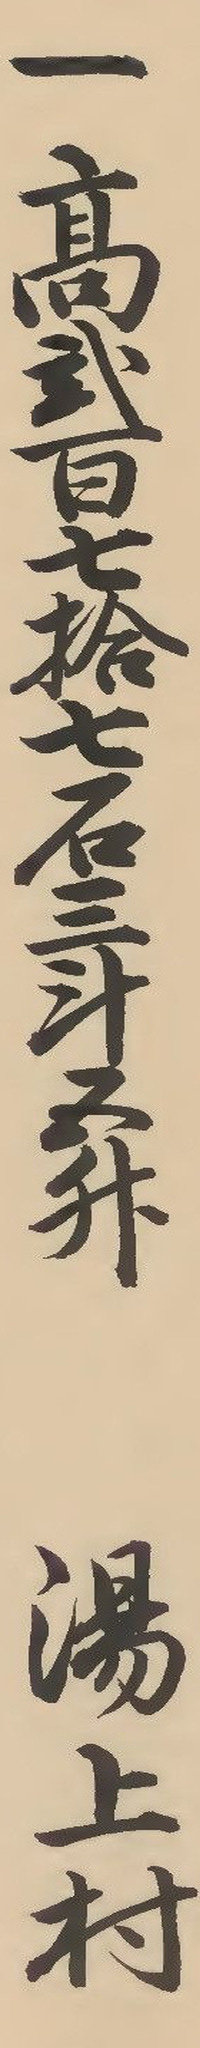一高弐百七拾七石三斗五升湯上村
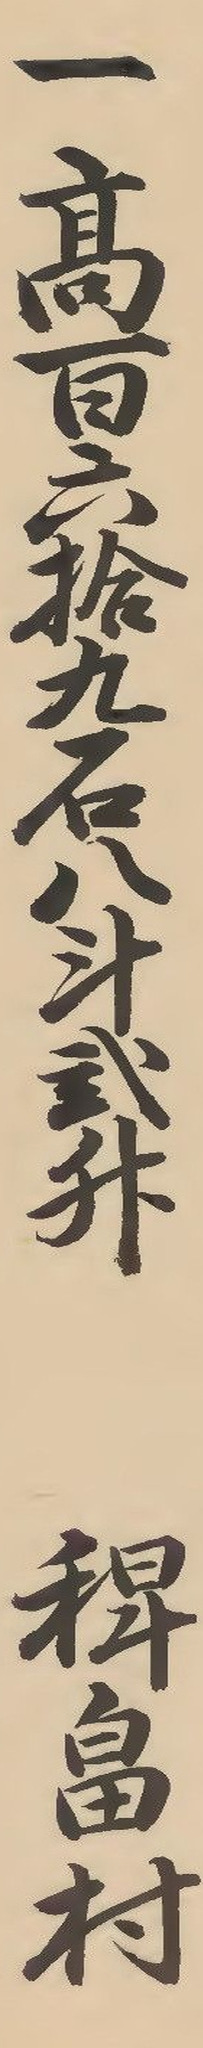一高百六拾九石八斗弐升稗畠村
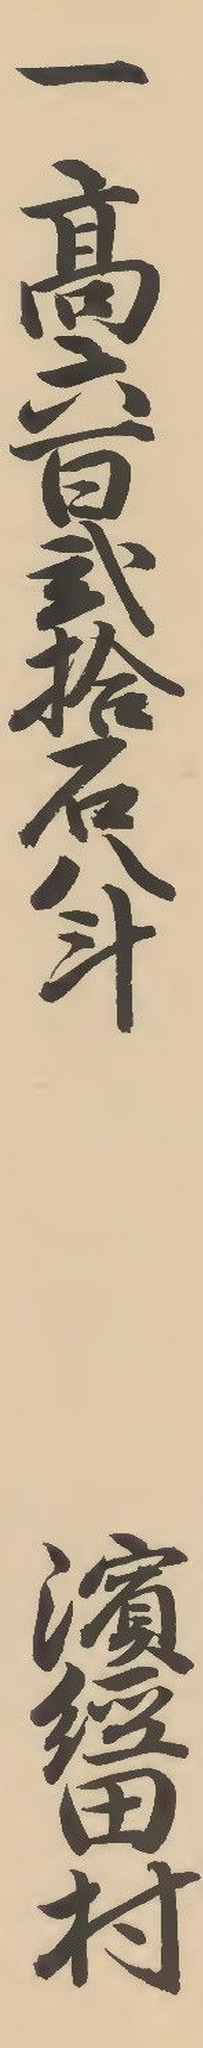一高六百弐拾石八斗浜経田村
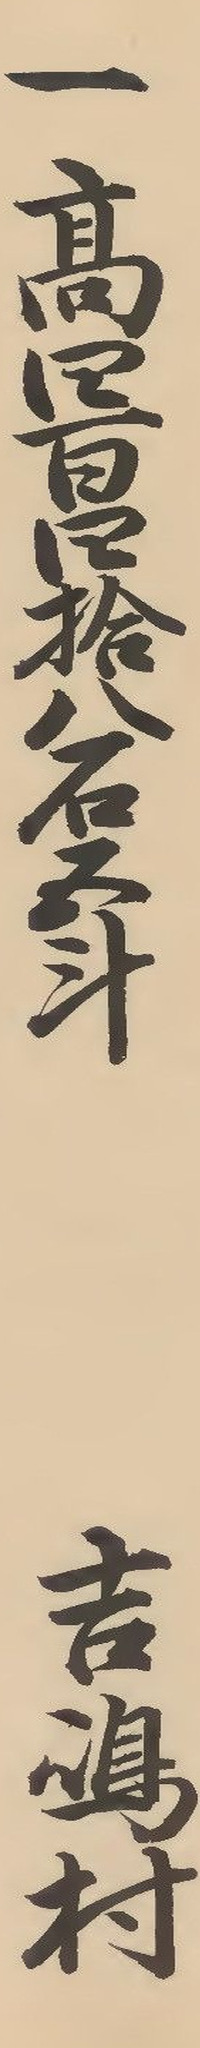一高四百四拾八石五斗吉島村
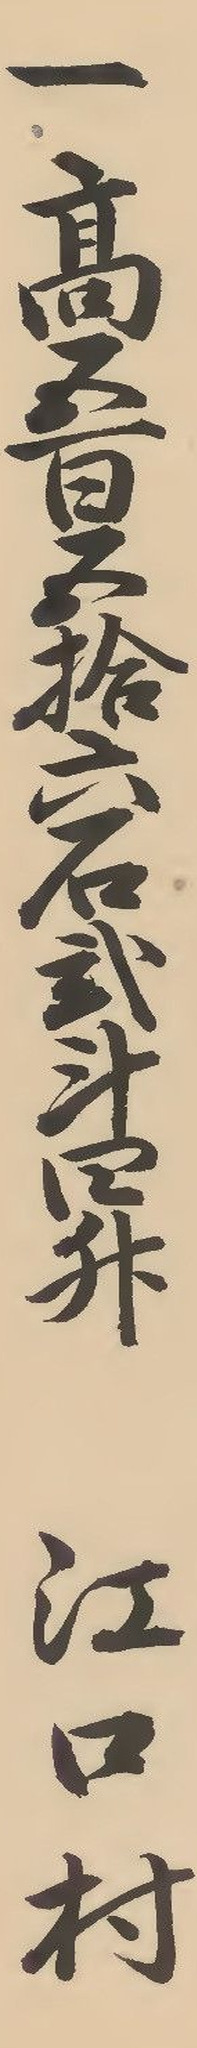一高五百五拾六石弐斗四升江口村

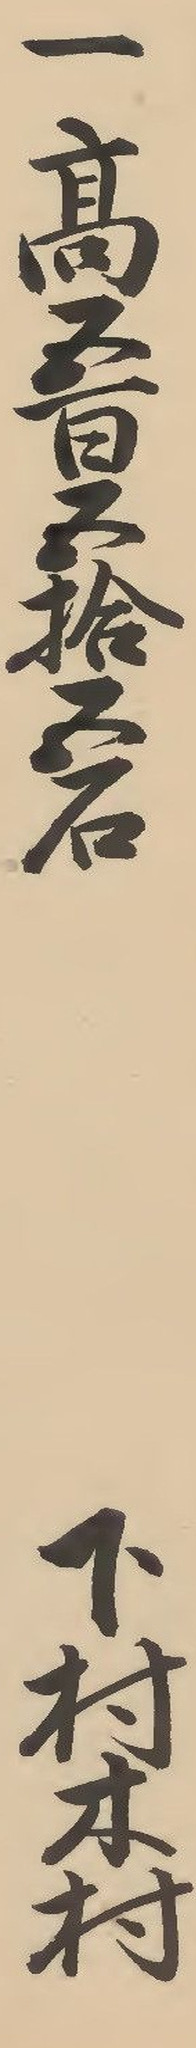一高五百五拾五石下村木村
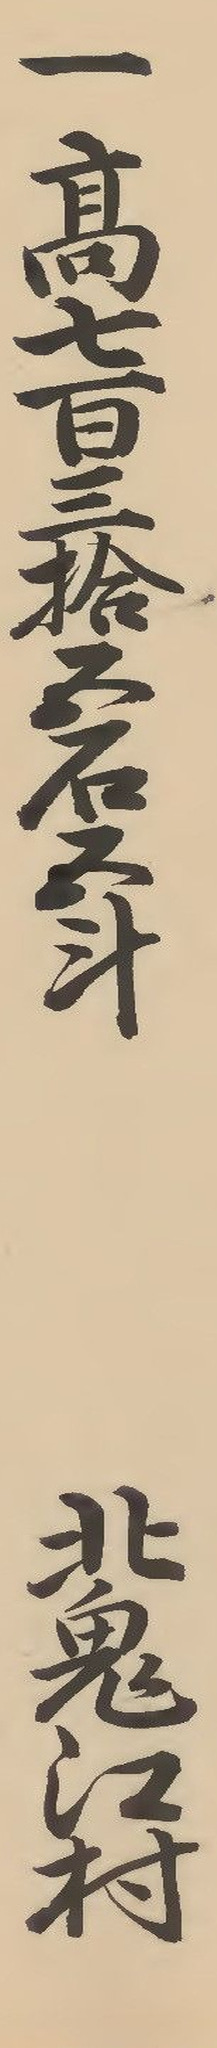一高七百三拾五石五斗北鬼江村
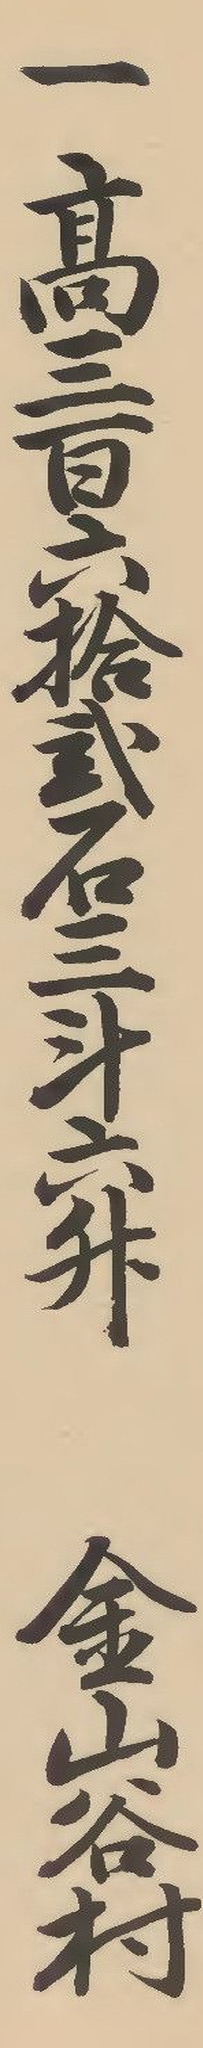一高三百六拾弐石三斗六升金山谷村
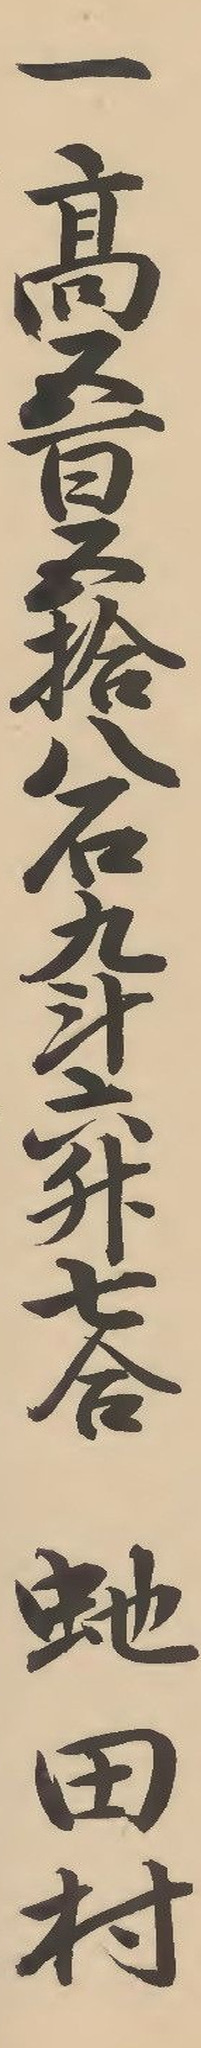一高五百五拾八石九斗六升七合蛇田村
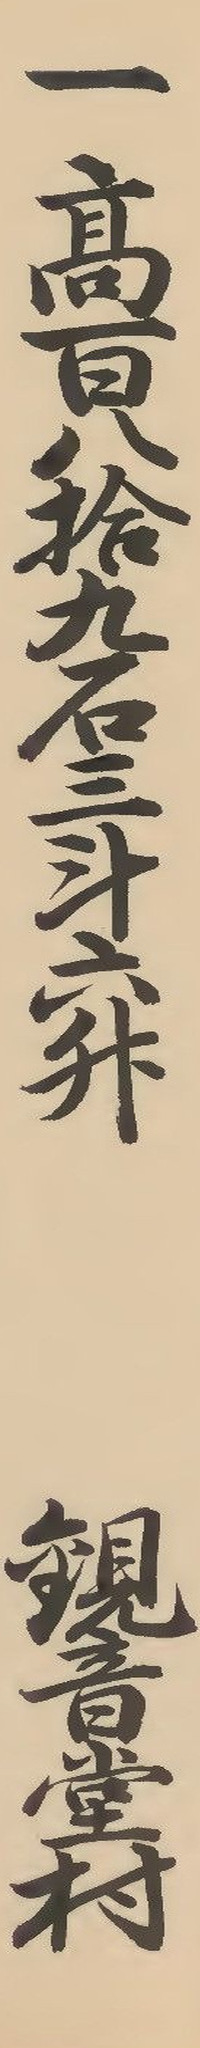一高百八拾九石三斗六升観音堂村
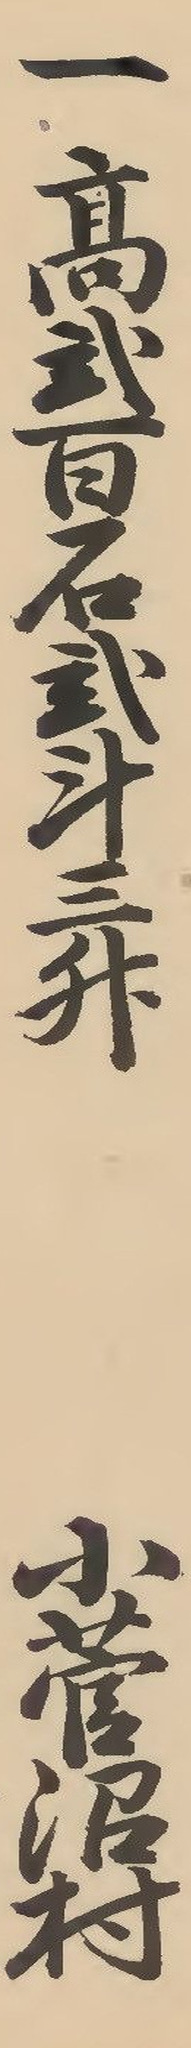一高弐百石弐斗三升小菅沼村
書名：越中国郷帳
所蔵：国立公文書館 National Archives of Japan
